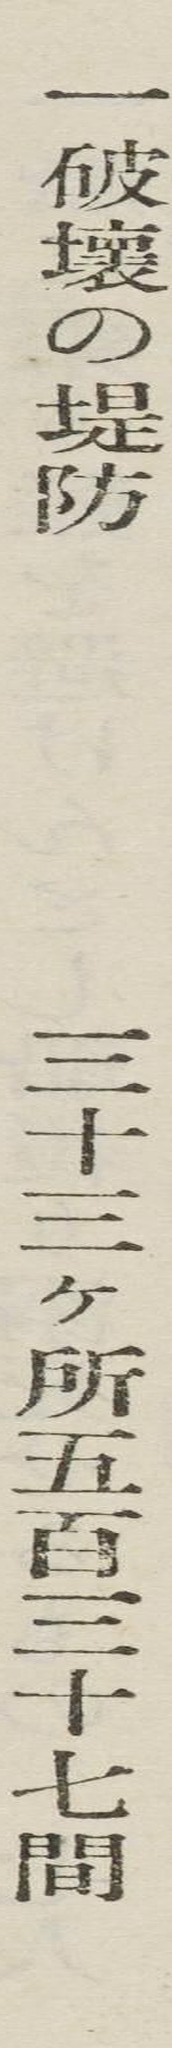一破壊の堤防三十三ケ所五百三十七間
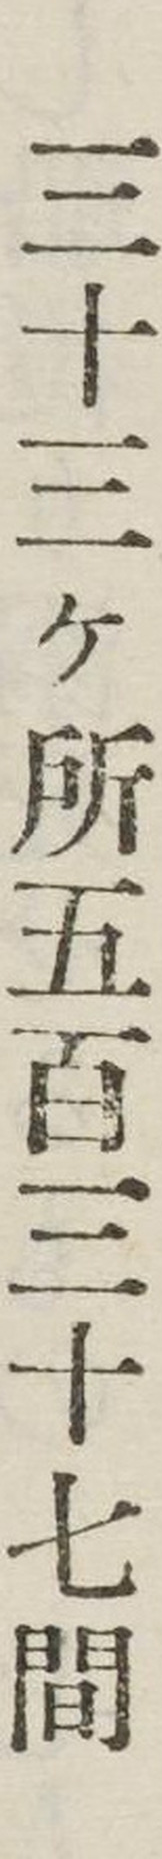一破壊の堤防三十三ケ所五百三十七間
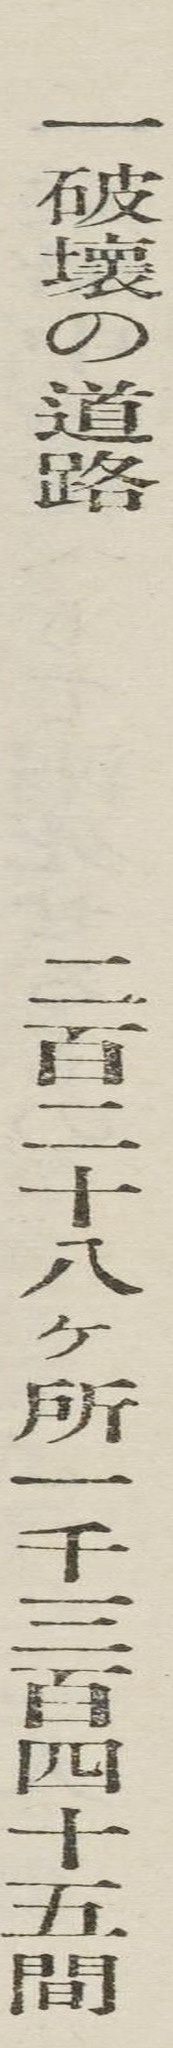一破壊の道路二百二十八ケ所一千三百四十五間
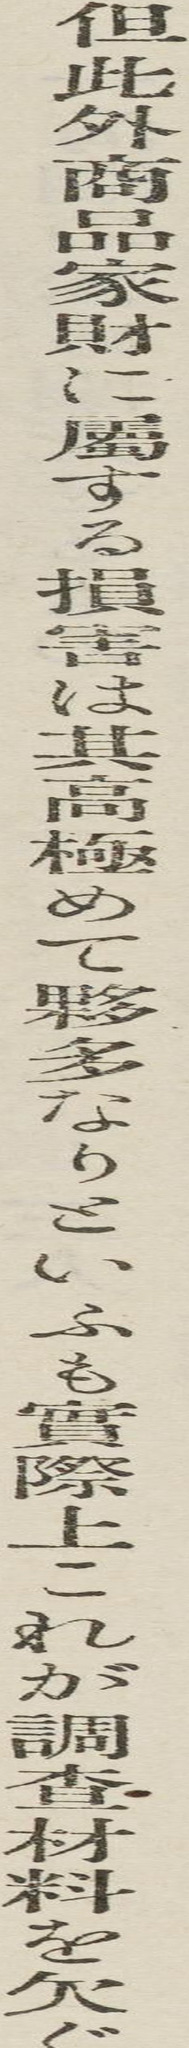但此外商品家財に属する損害は其高極めて夥多なりといふも実際上これが調査材料うぃ欠ぐ
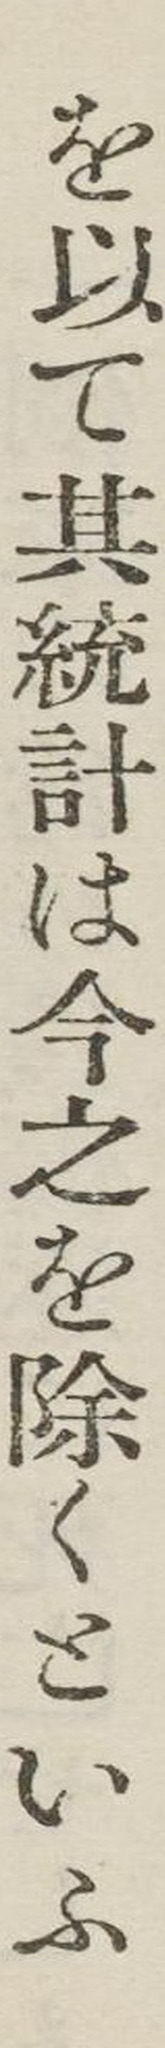を以て其統計は今之を除くといふ
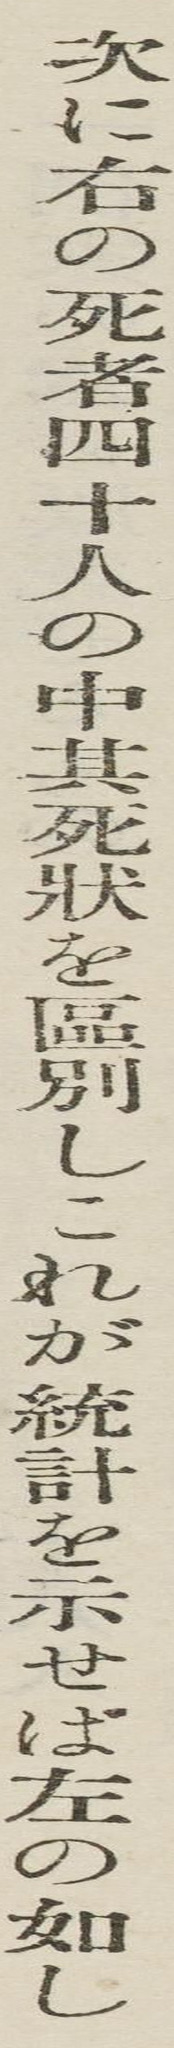次に右の死者四十人の中其死状を区別しこれが統計を示せば左の如し

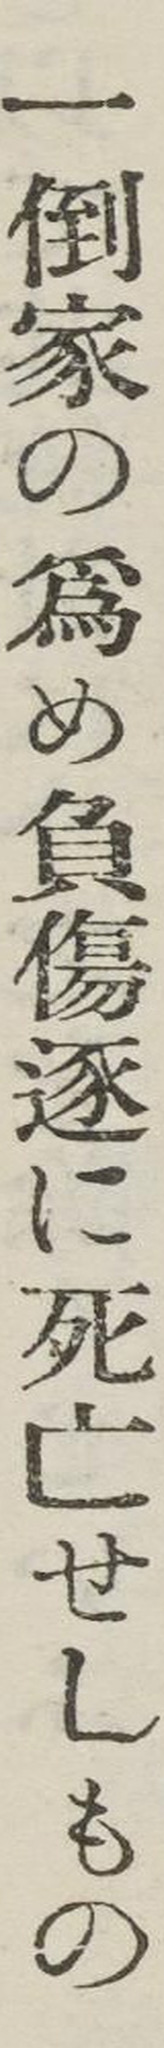一倒家の為め負傷遂に死亡せしもの三人
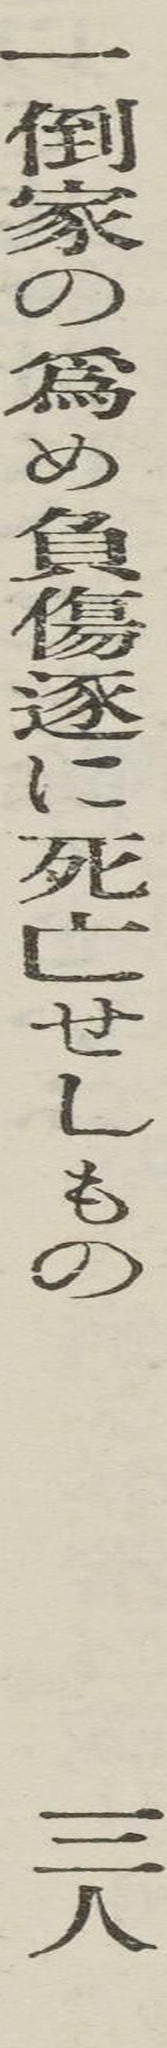一倒家の為め負傷遂に死亡せしもの三人
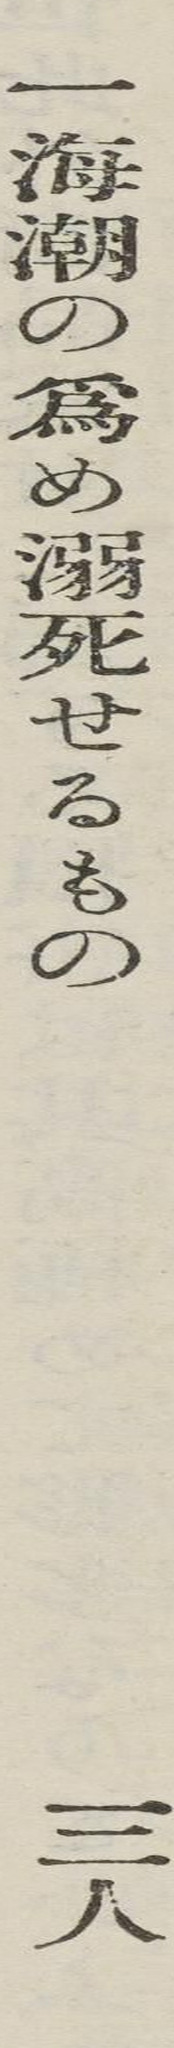一海潮の為め溺死せるもの三人
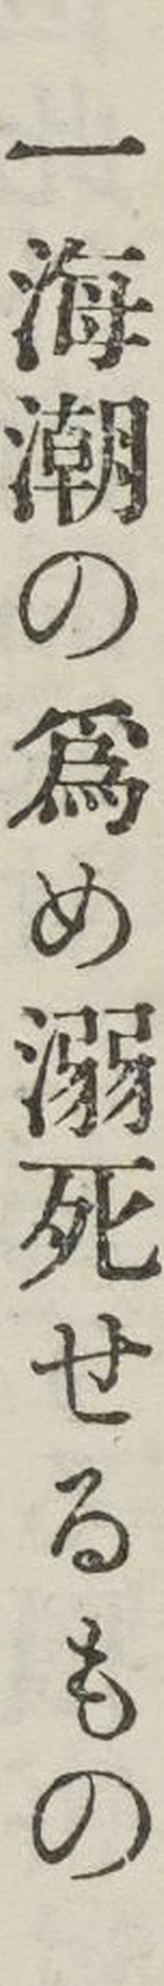一海潮の為め溺死せるもの三人
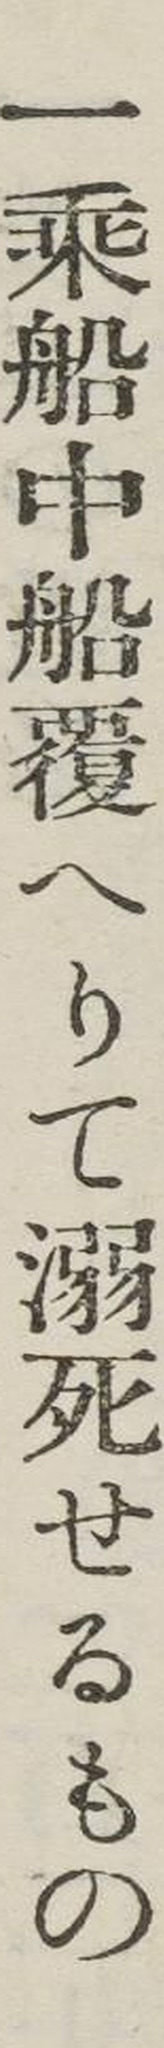一乗船中船覆へりて溺死せるもの一人
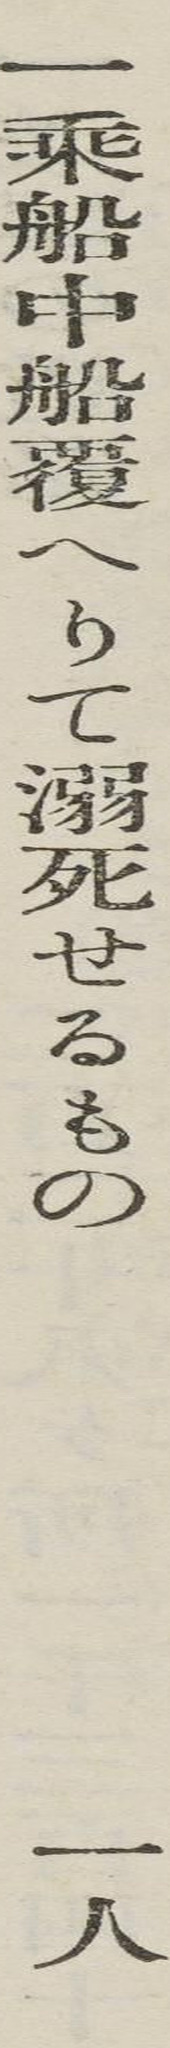一乗船中船覆へりて溺死せるもの一人
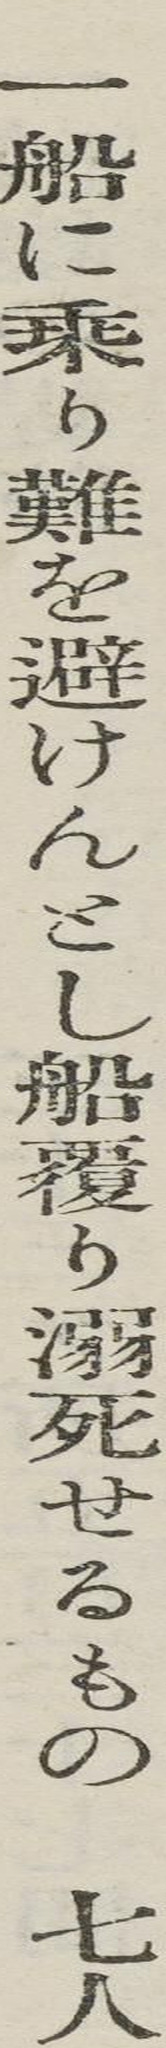一船に乗り難を避けんとし船覆り溺死せるもの七人
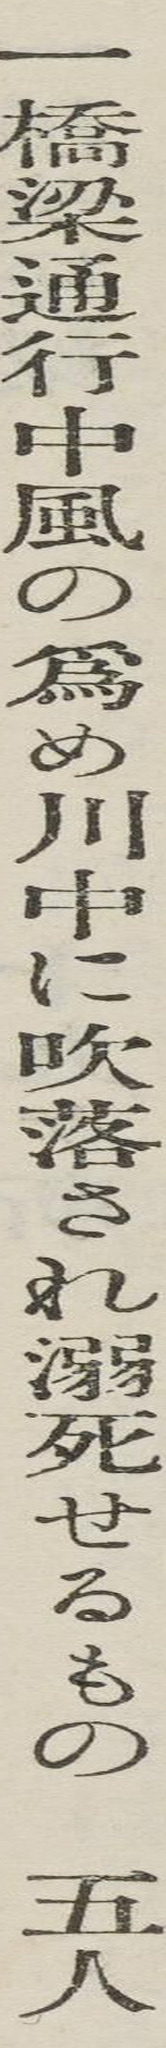一橋梁通行中風の為め川中に吹落され溺死せるもの五人
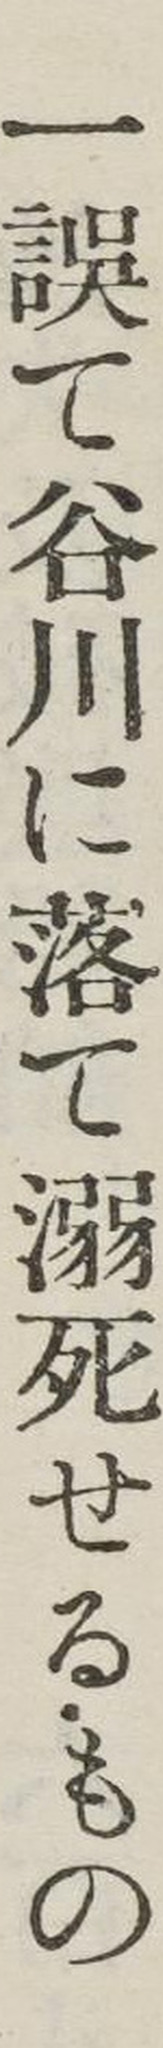一誤て谷川に落て溺死せるもの一人
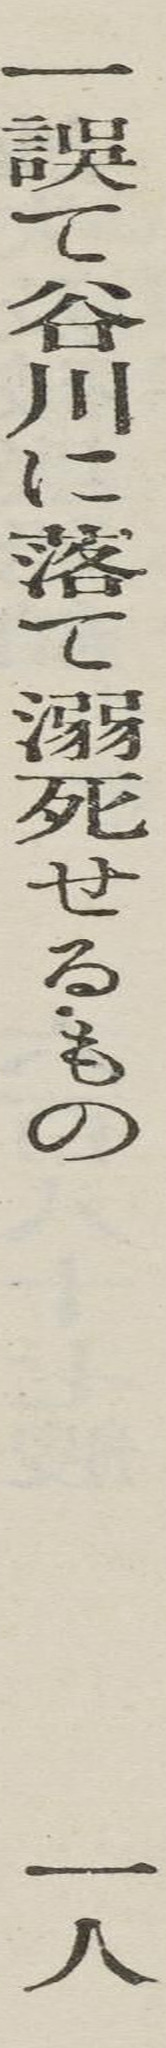一誤て谷川に落て溺死せるもの一人
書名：土佐古今ノ地震
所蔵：東京大学地震研究所図書室 Earthquake Research Institute Library, The University of Tokyo, JAPAN
